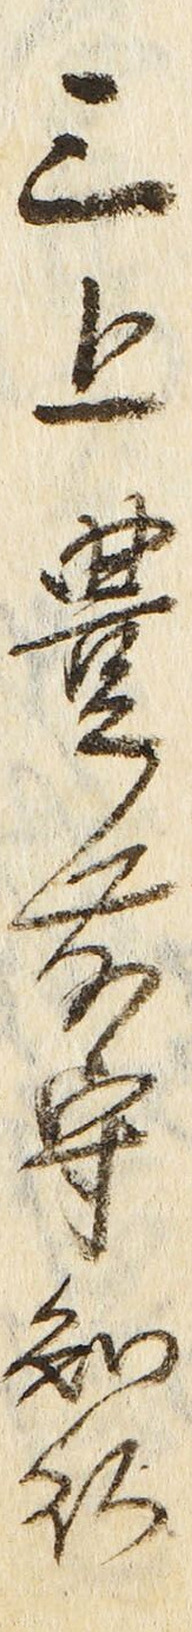三上豊前守知行
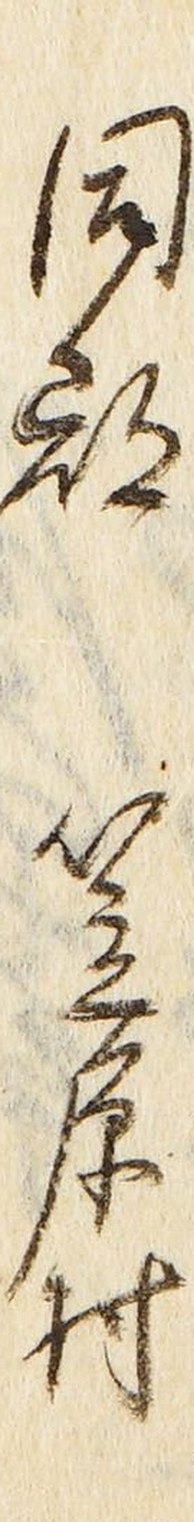同郡笠原村
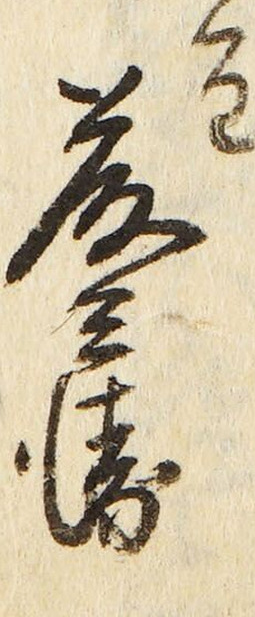藤兵衛
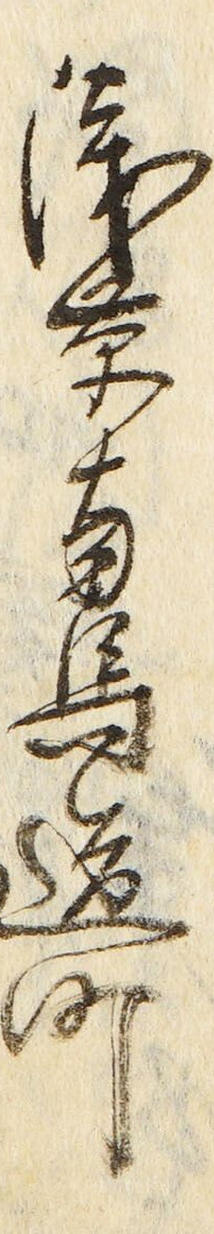浅草南馬道町
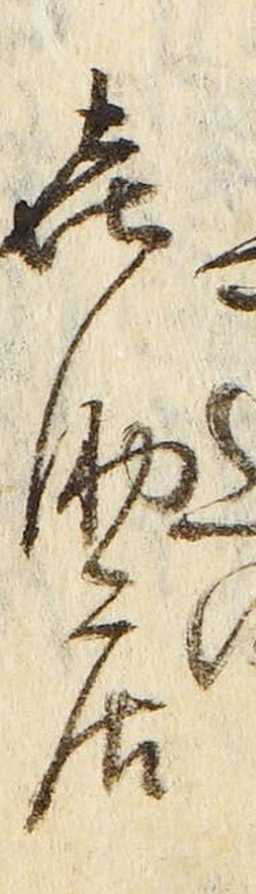喜助店

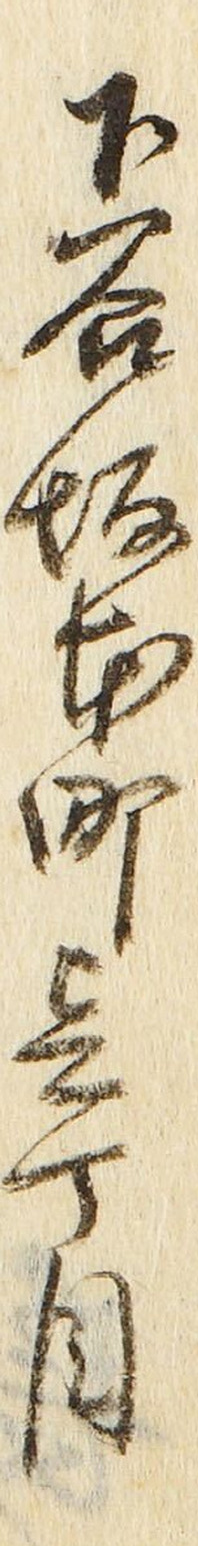下谷坂本町壱丁目
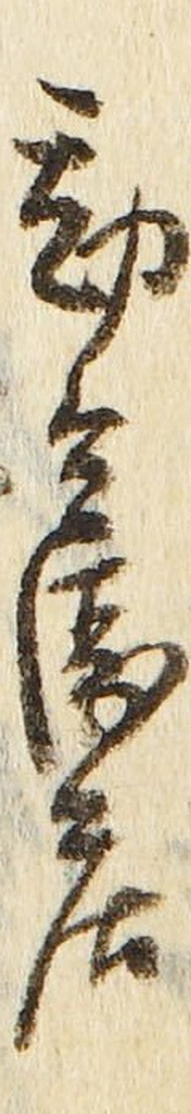勘兵衛店
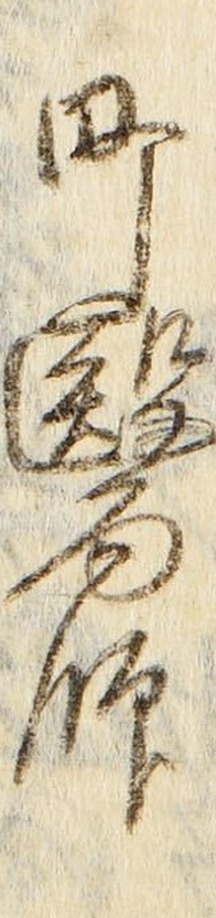町医師
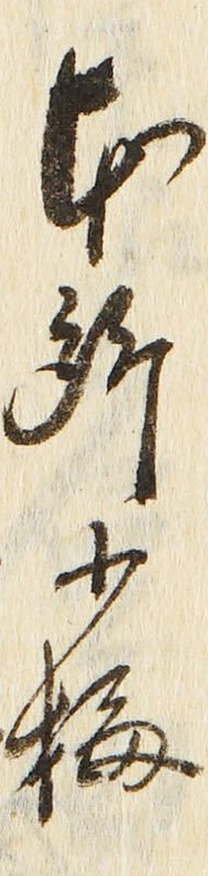本所小梅
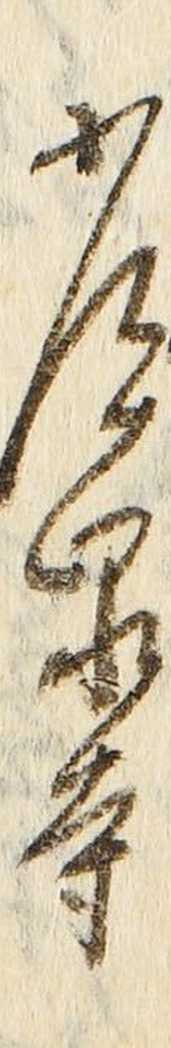常泉寺
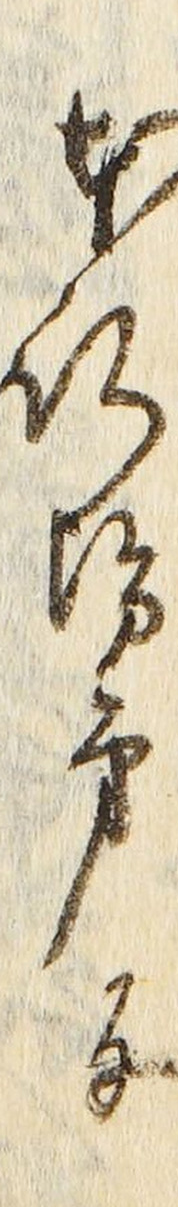本役坊弟子
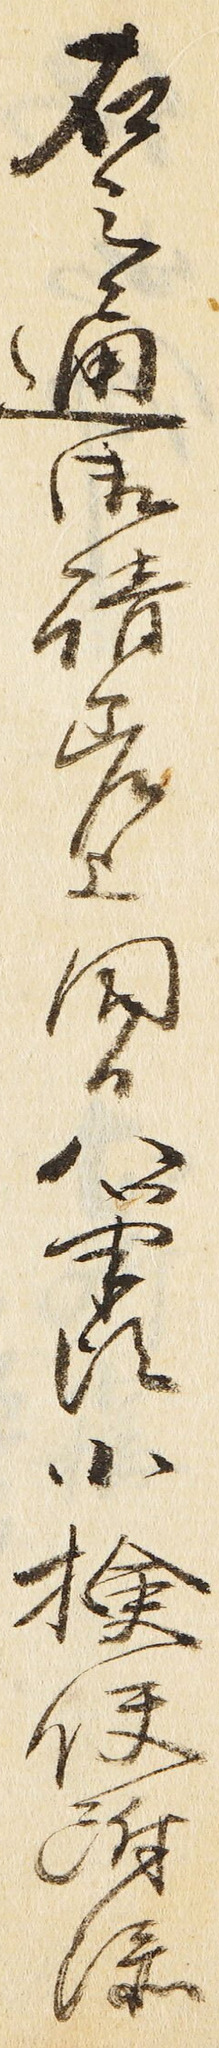右之通御請差上同日八ッ半頃小検使附添
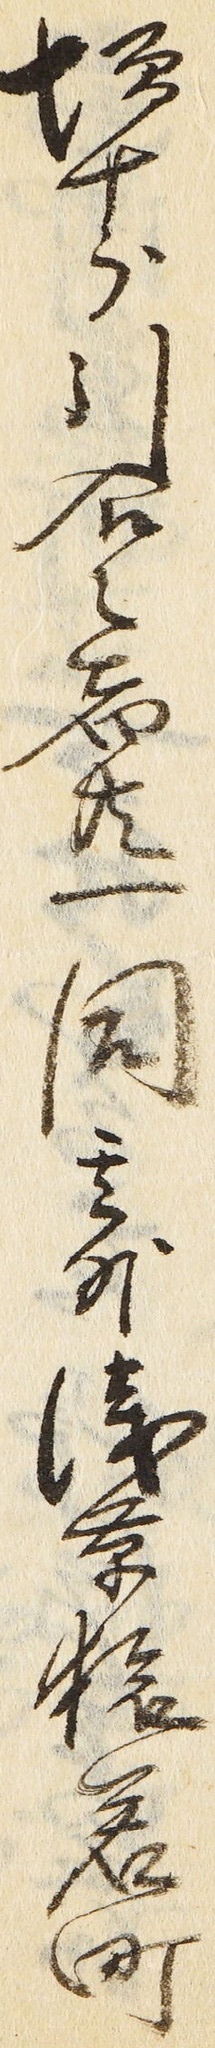増十郎引合之者共一同其外浅草猿若町
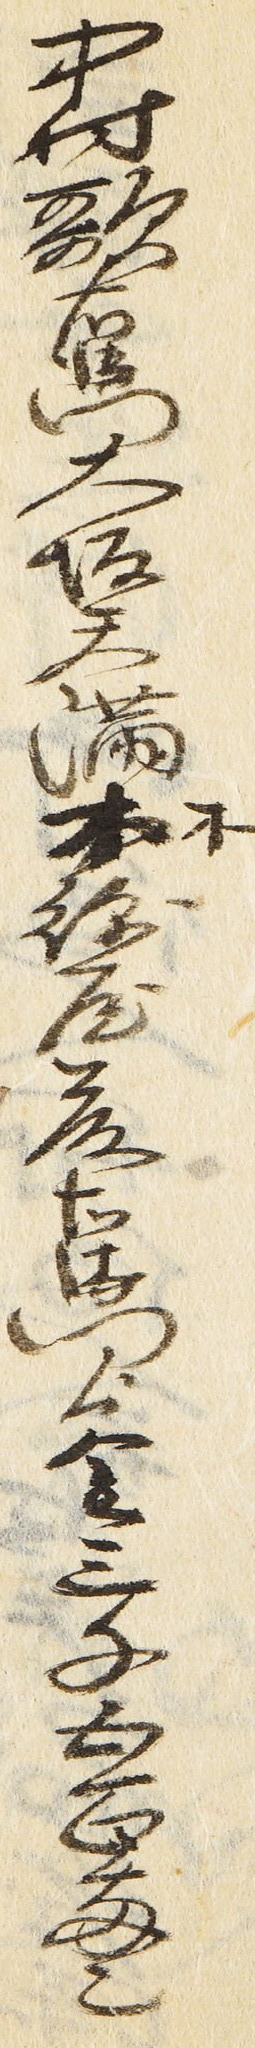中村歌右衛門大坂天満木綿屋藤右衛門ゟ金三千五百両之
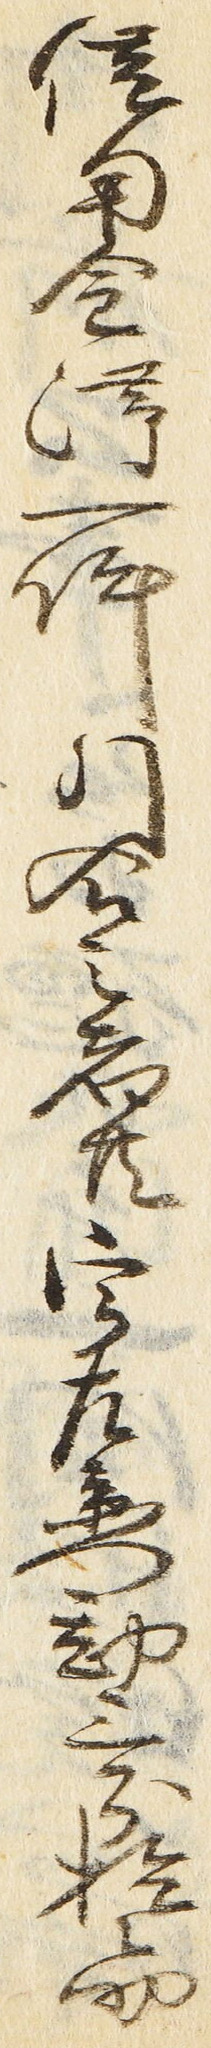借用金滞一件引合之者共宇左衛門勘三郎権之助
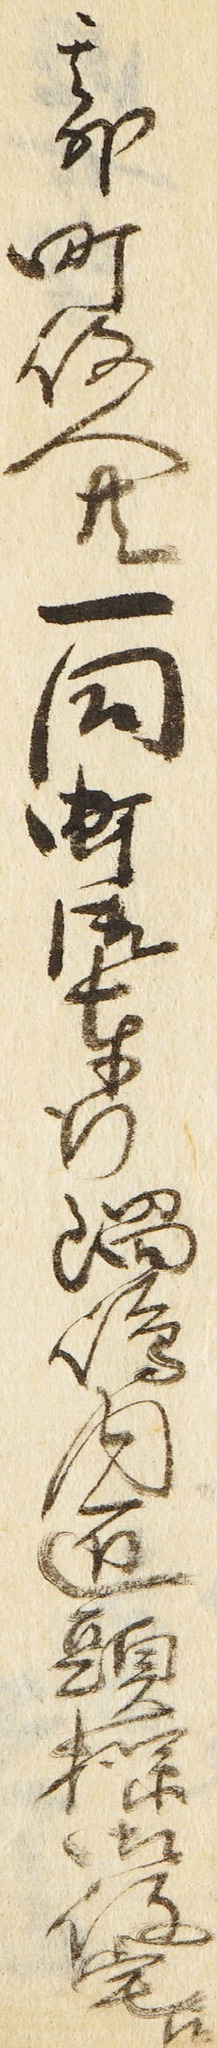其外町役人共一同町御奉行鍋嶋内匠頭様御役宅江
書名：異流一件日記
